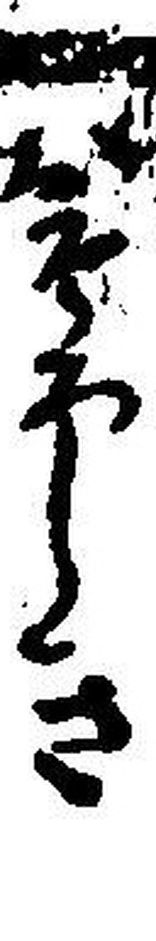おそろしき
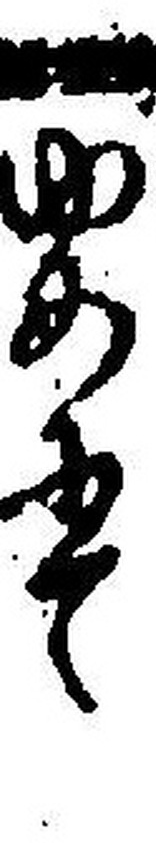ゆめにて
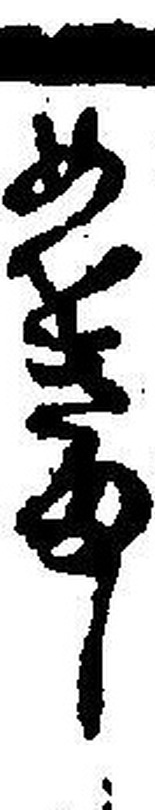めをさまし
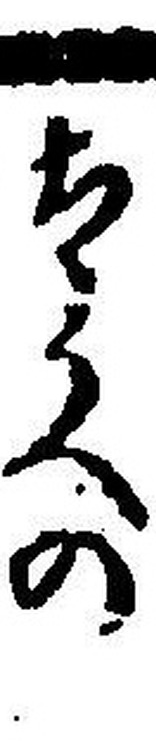ちゝうへの
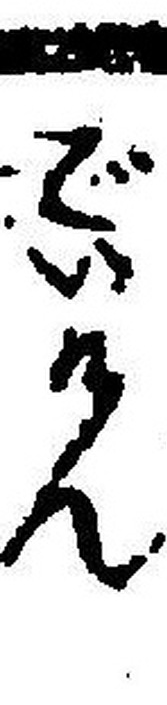ごいけん
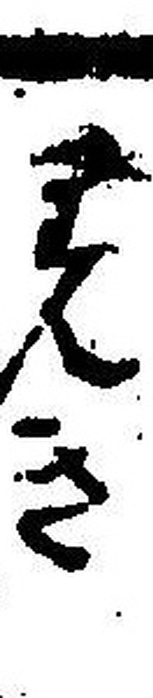りんき
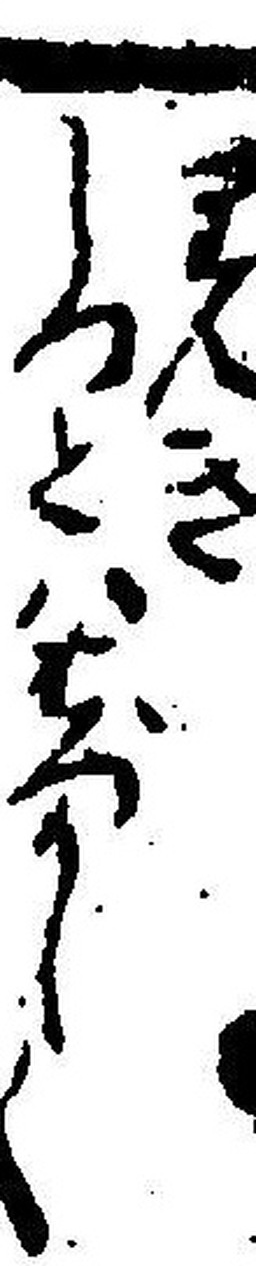しつとははつかしく
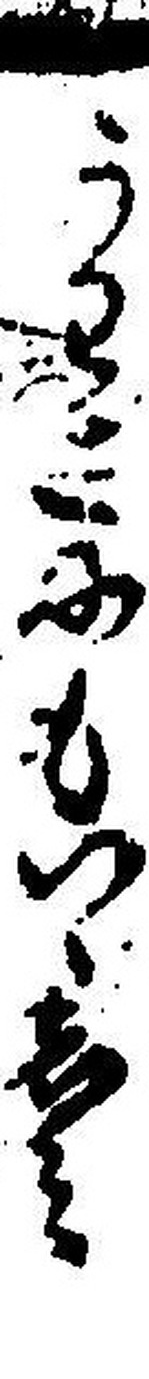うわきにもいゝしみ？
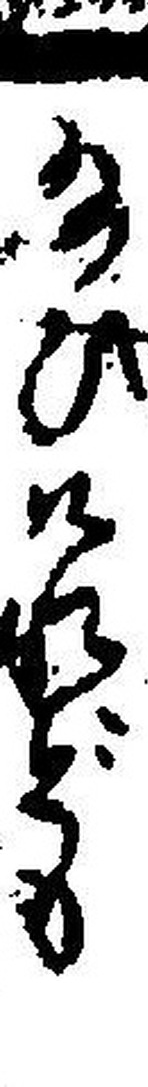たまひけれども
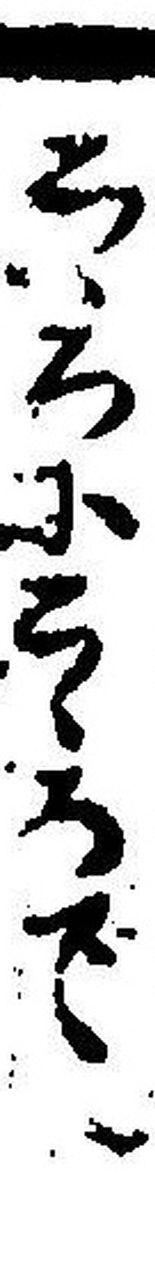こゝろにこゝろで
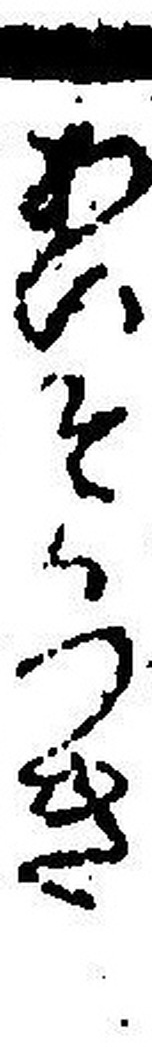あいそかつき
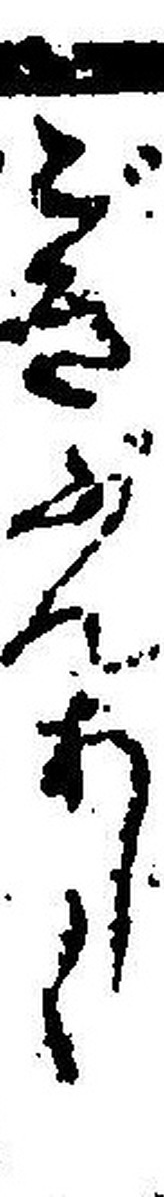ごきぶんあしく
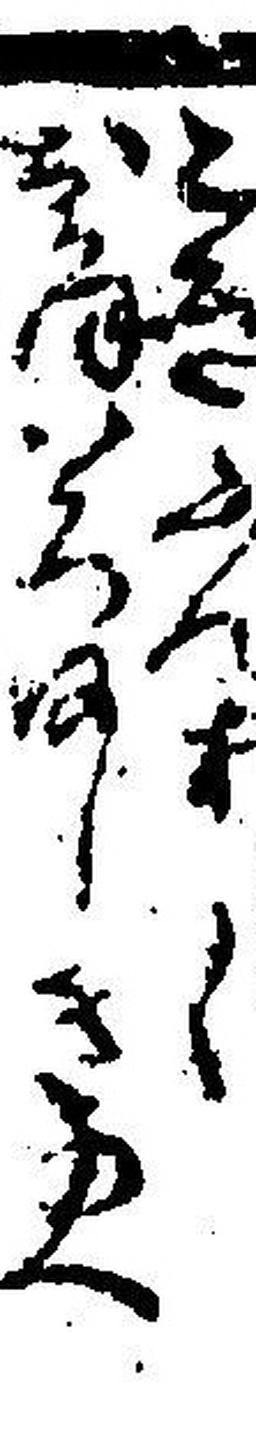おかほいろあしきゆへ
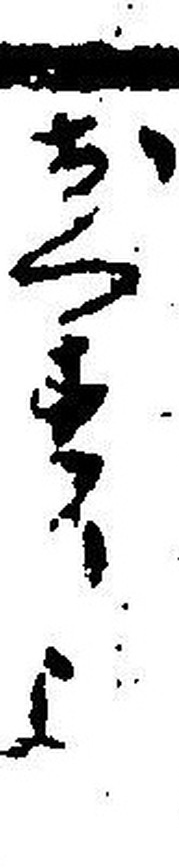おくすりよ
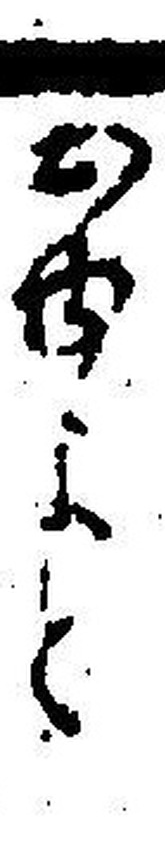おゆよと
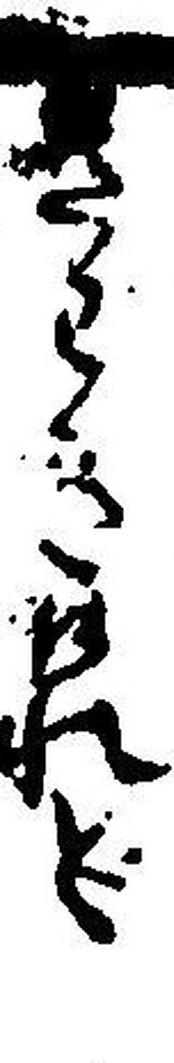さわきけれど
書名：御代参牛時詣 / 市場通笑作
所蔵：東京大学総合図書館 General Library in the University of Tokyo, JAPAN
